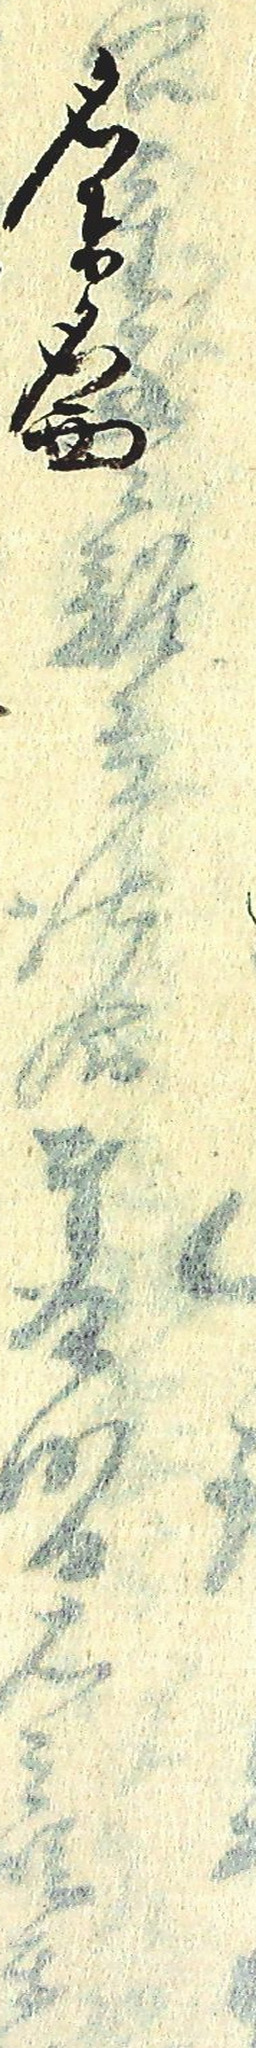名東名西
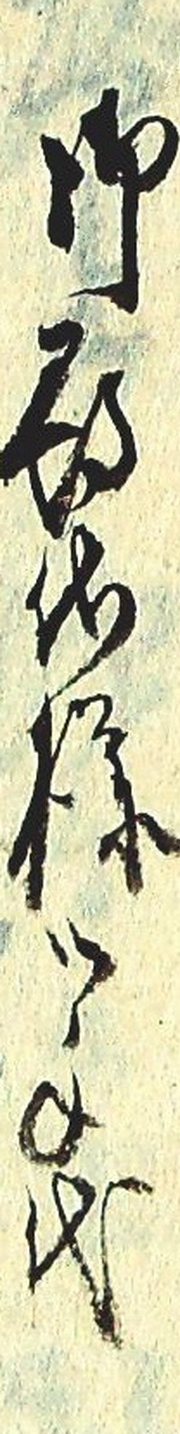御郡代様御手代
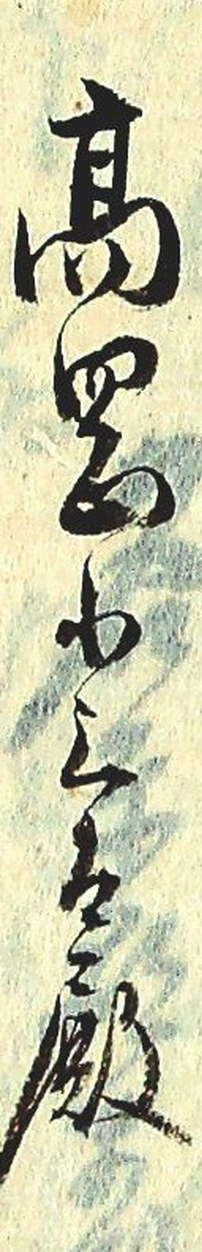高岡小三太殿
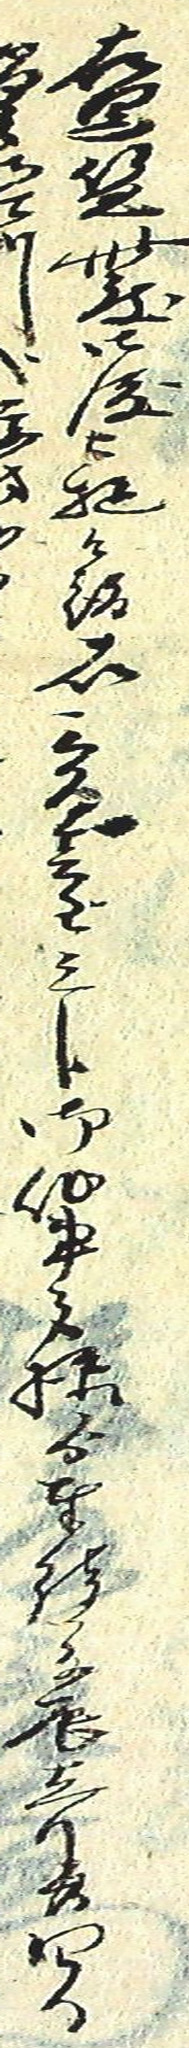右運賃此度御渡被遊候趣を以三百壱匁三分御作事方様ゟ奉請取辰十二月廿四日
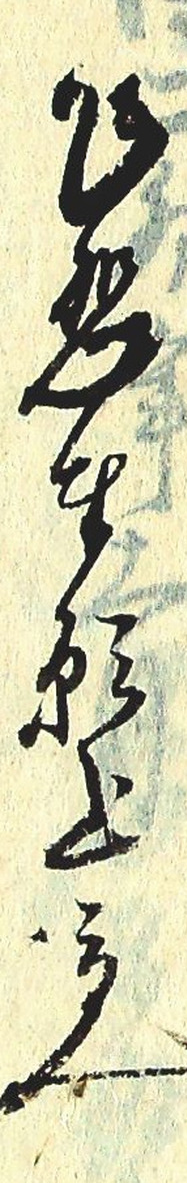乍恐奉願上覚
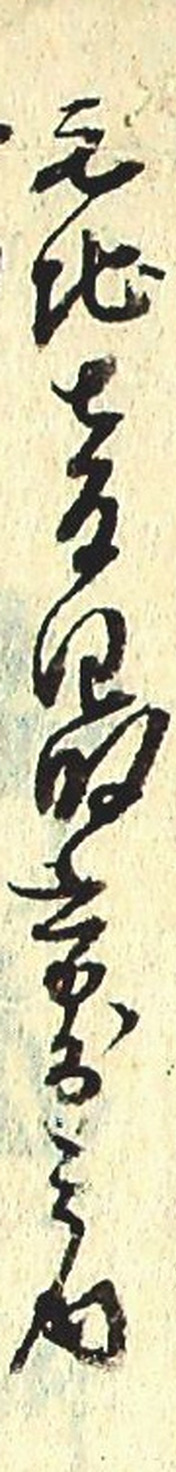元地七反四畝六歩之内

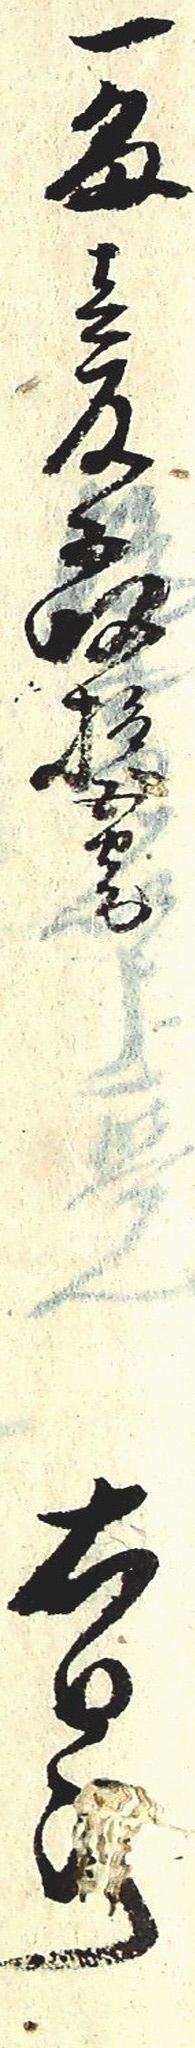一畠壱反五畝拾五歩右同断
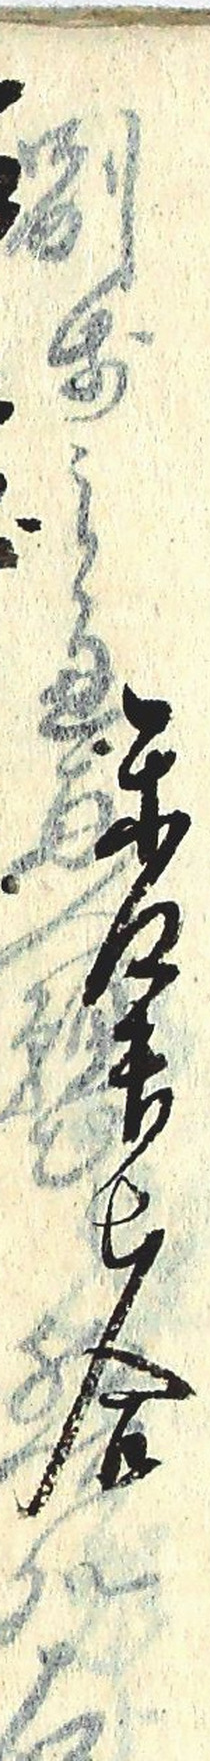米四升七合
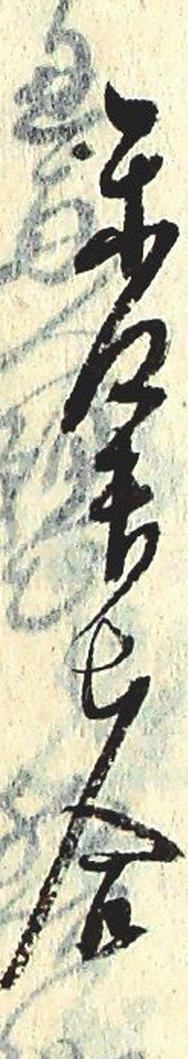米四升七合
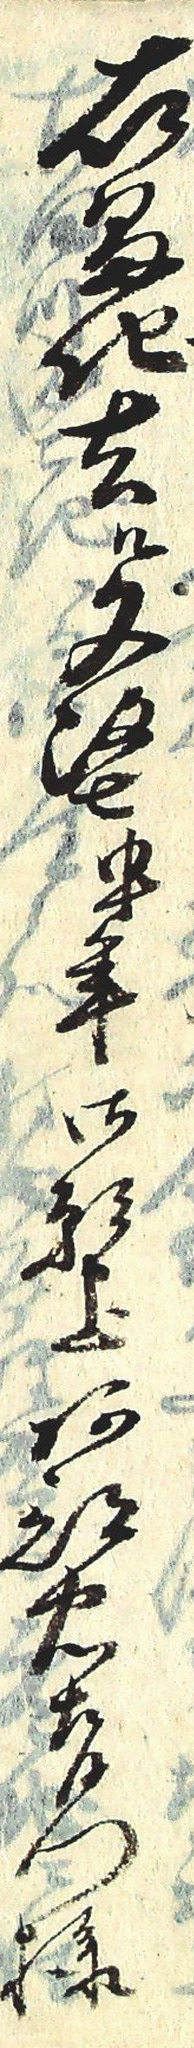右畠地去る文政七申年御願申上阿部忠右衛門様
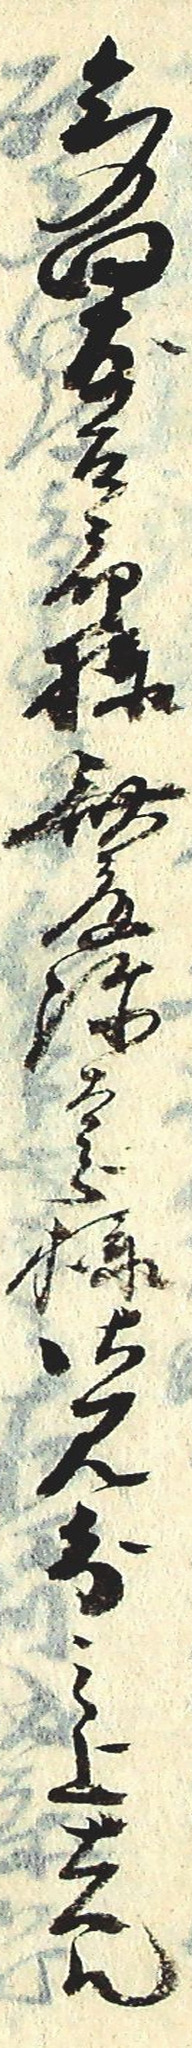多田友太郎様斎藤弥太郎様御見分之上去る
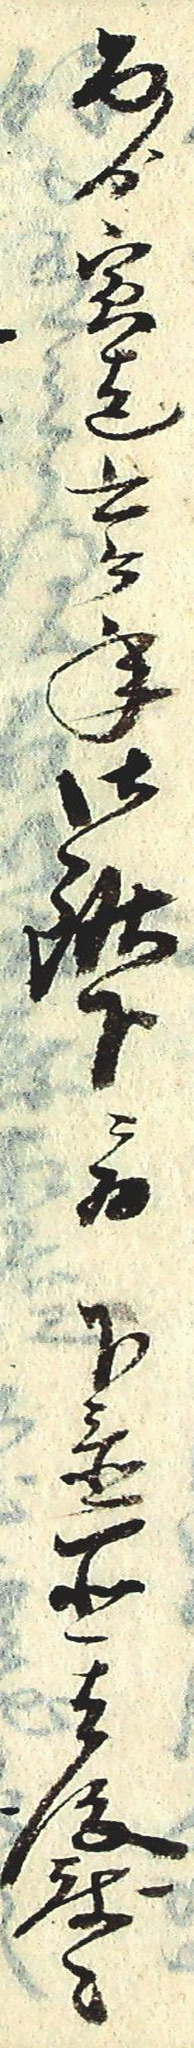酉ゟ寅迄六ヶ年御鍬下被為下置所其後度々
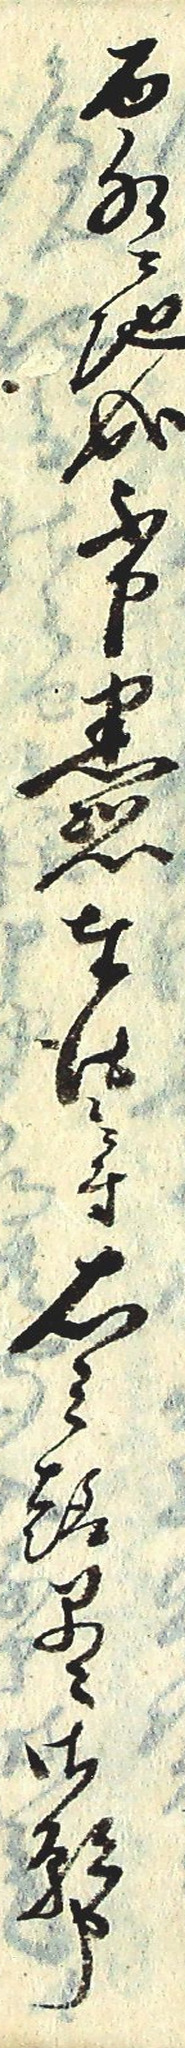酉卯に地成不申迷惑奉仕に付右之趣早々御願申
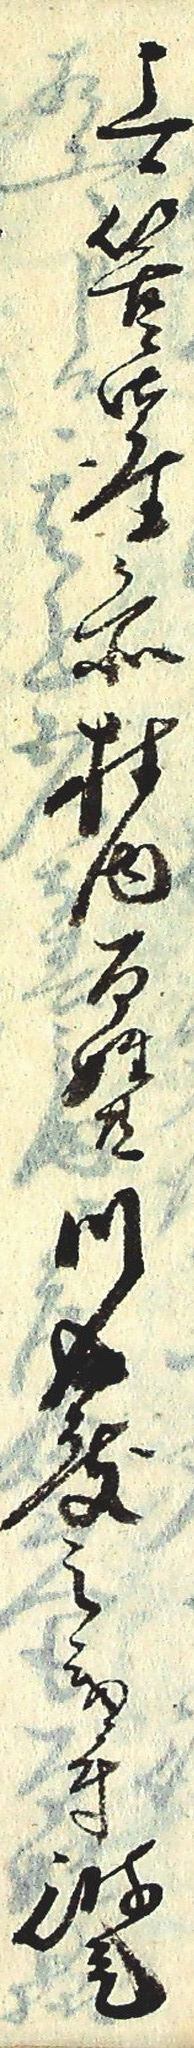上候筈に御座候所村内百姓共川成度々候義に付彼是
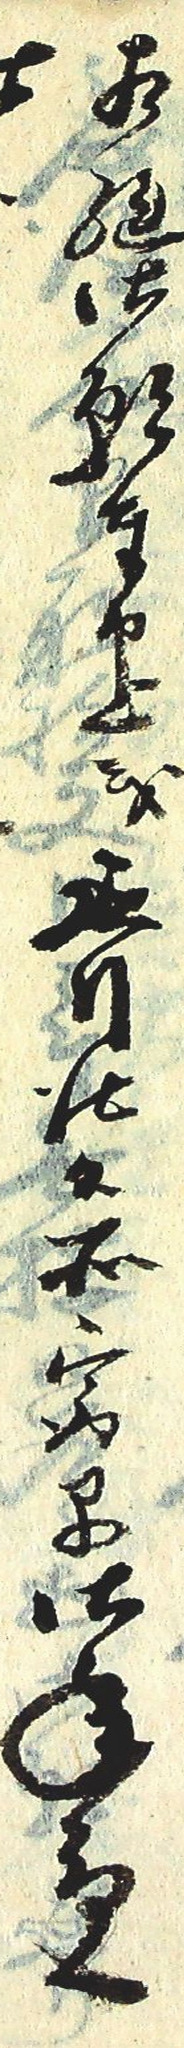相継御願奉申上義延引仕候所最早御年貢
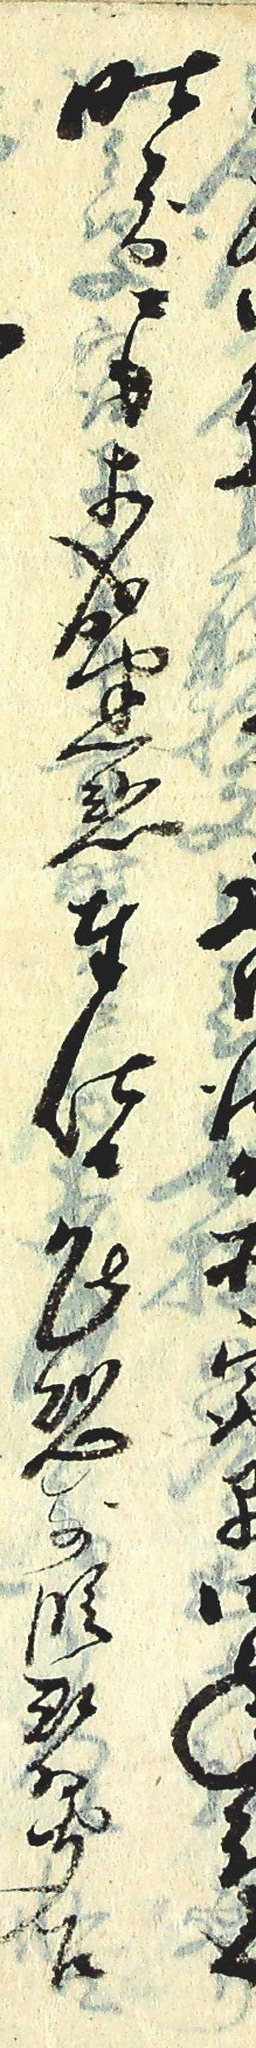時分にも相成迷惑奉仕候乍恐前段被為聞召
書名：諸御願書控(弐番）
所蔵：鳴門教育大学 Naruto University of Education
